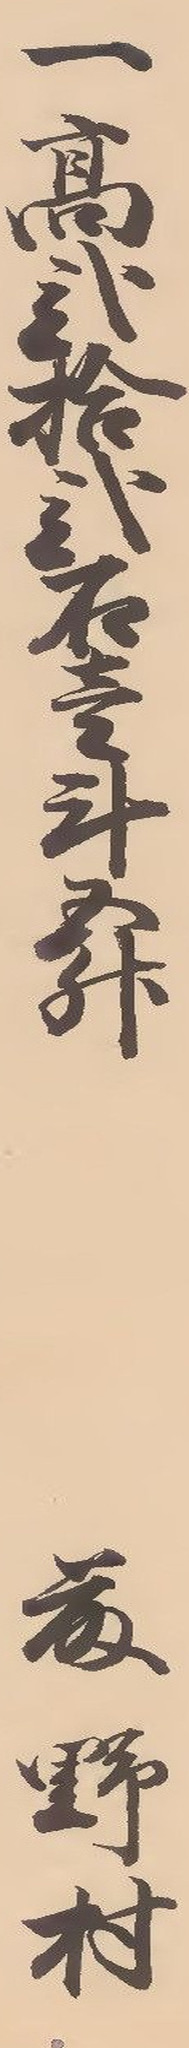一高弐拾弐石壱斗五升藤野村
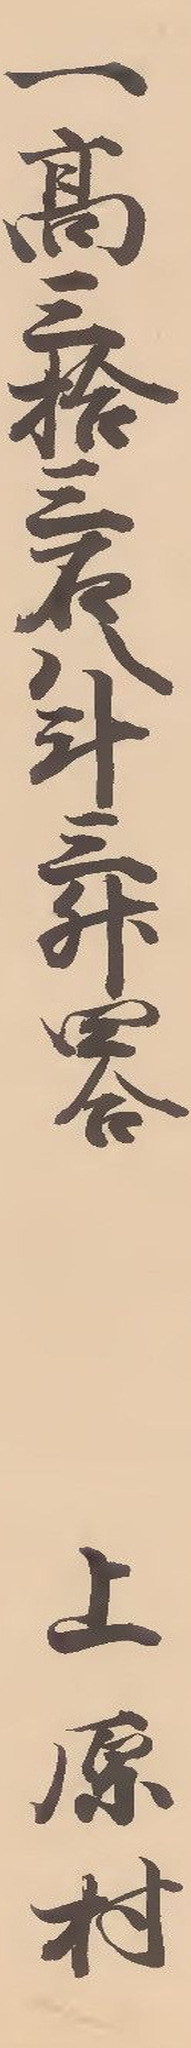一高三拾三石八斗三升四合上原村
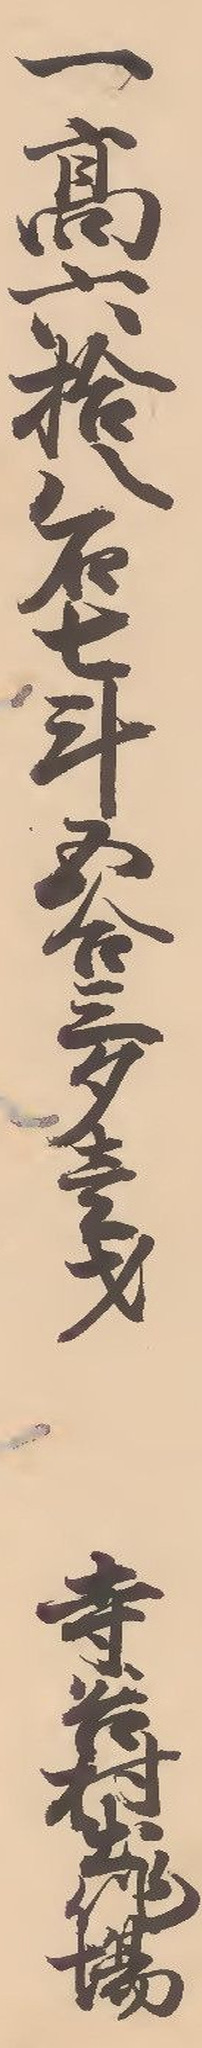一高六拾八石七斗五合三勺壱才寺谷村出作場

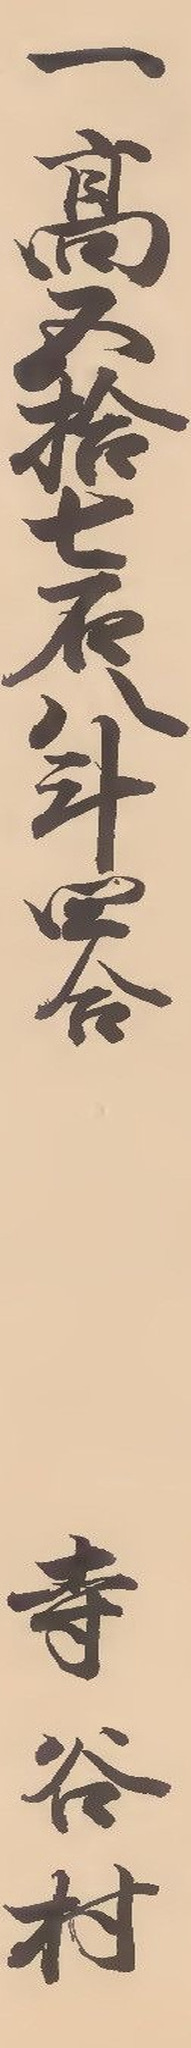一高五拾七石八斗四合寺谷村
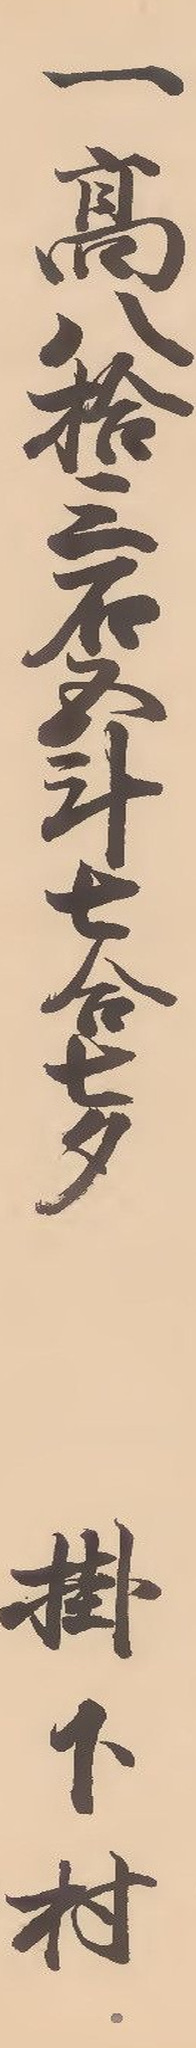一高八拾三石五斗七合七勺掛下村
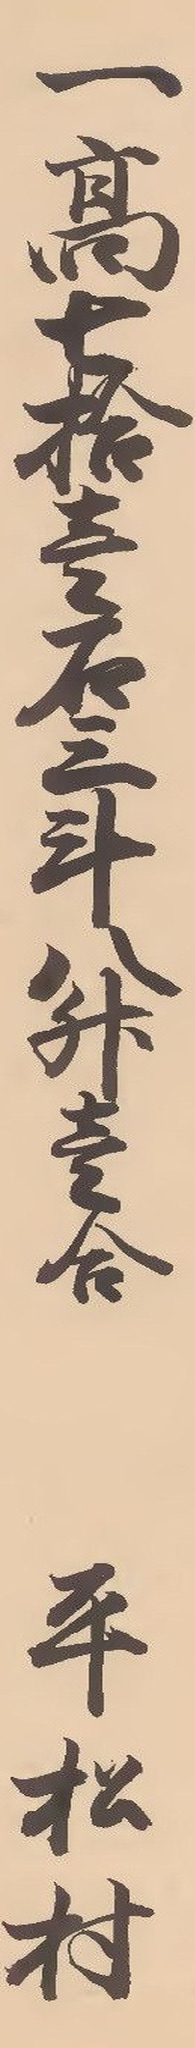一高七拾壱石三斗八升壱合平松村
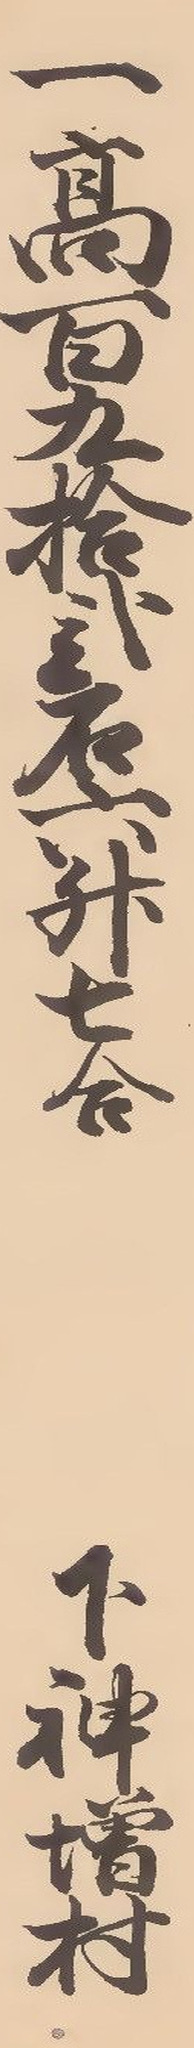一高百九拾弐石六升七合下神増村
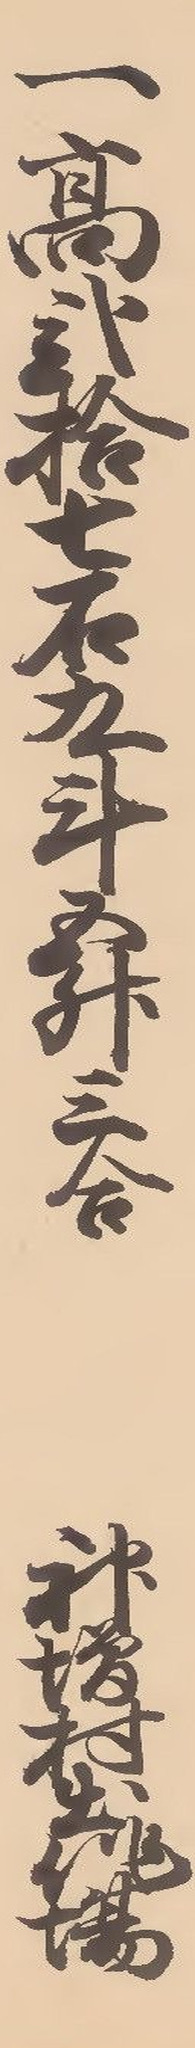一高弐拾七石九斗五升三合神増村出作場
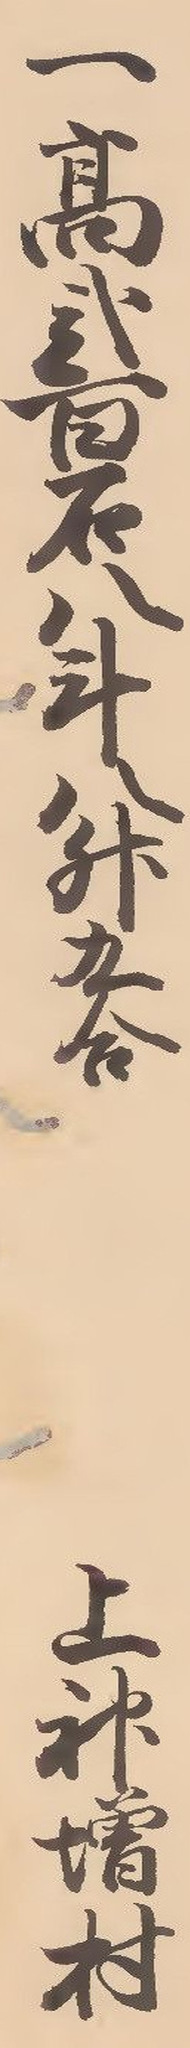一高弐百石八斗八升九合上神増村

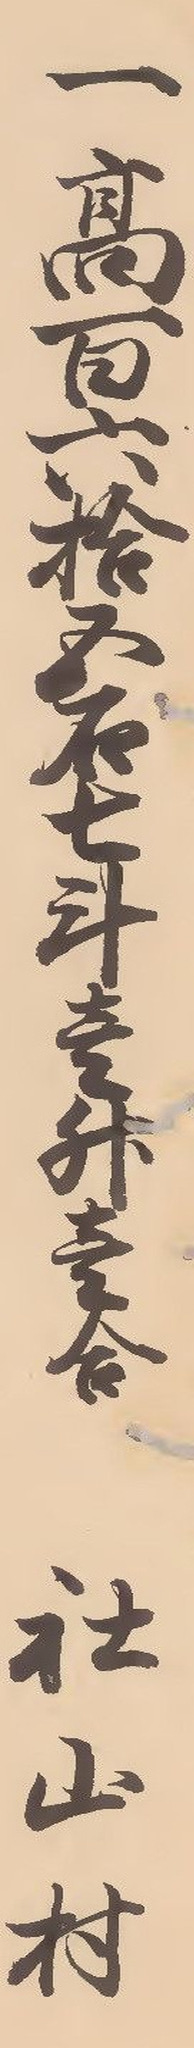一高百六拾五石七斗壱升壱合社山村
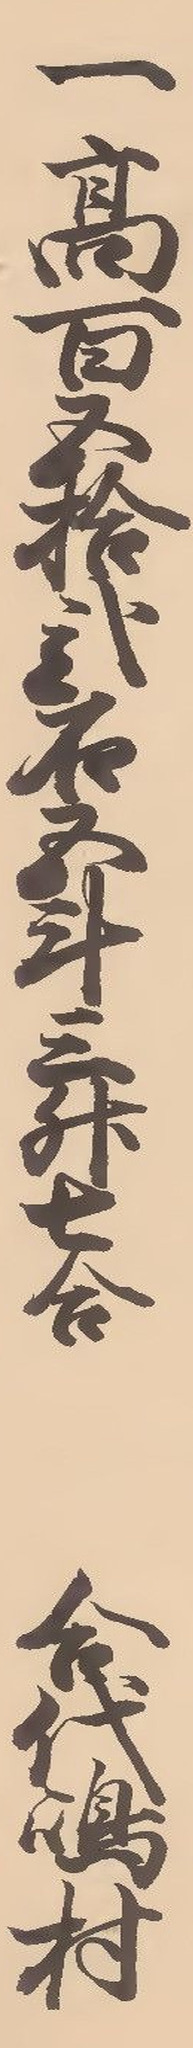一高百五拾弐石五斗三升七合合代島村
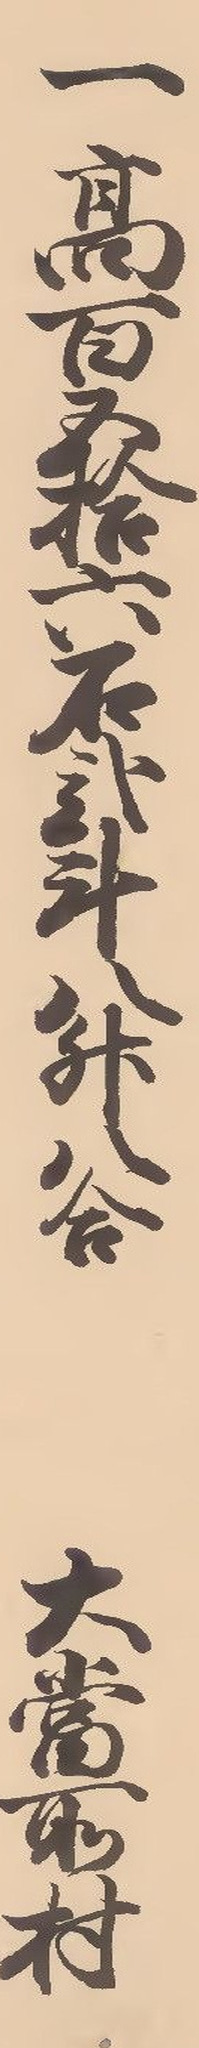一高百五拾六石弐斗八升八合大当所村
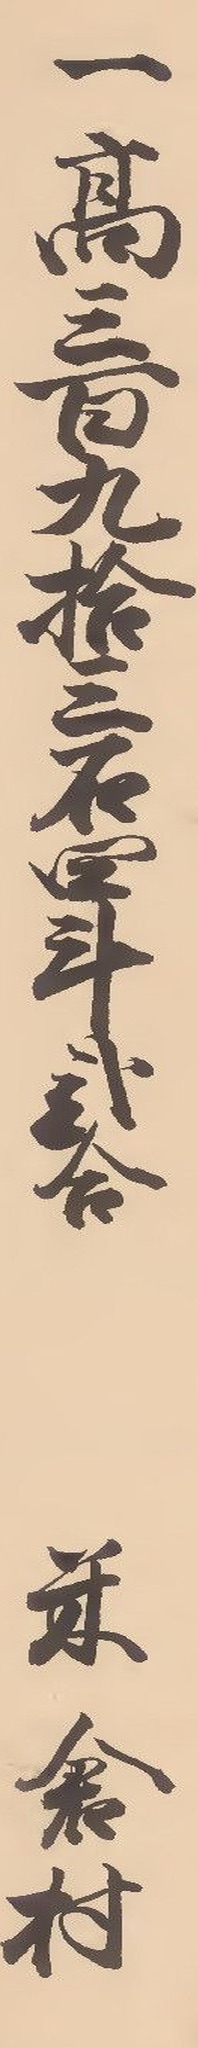一高三百九拾三石四斗弐合米倉村
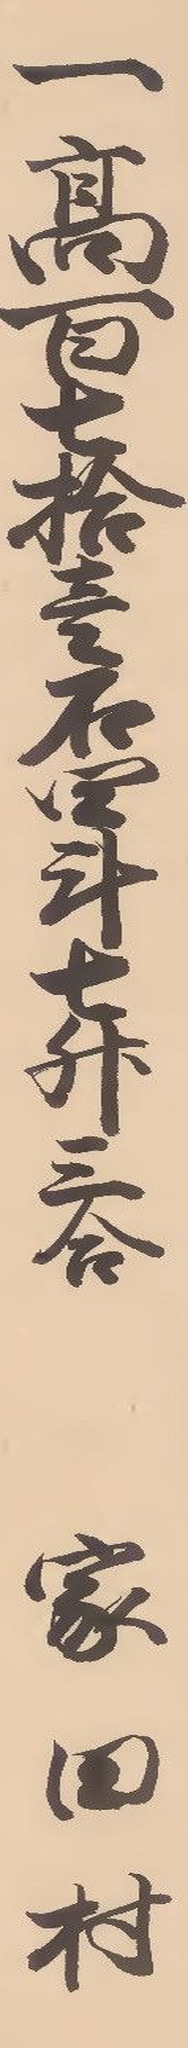一高百七拾壱石四斗七升三合家田村
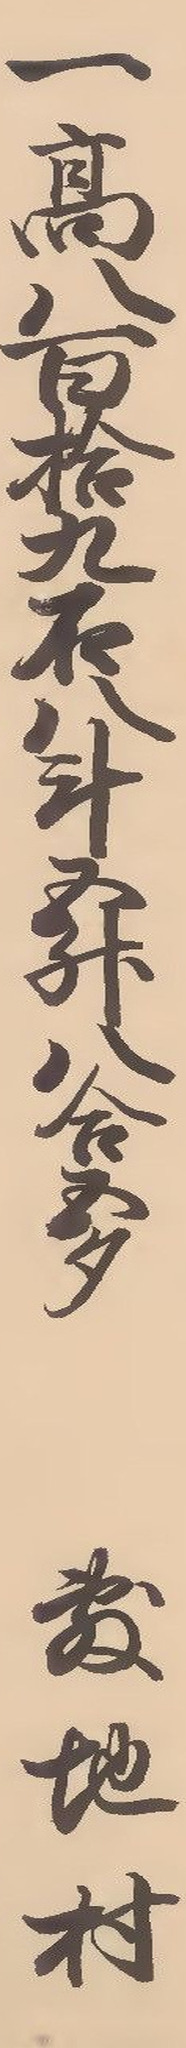一高八百拾九石八斗五升八合五勺敷地村
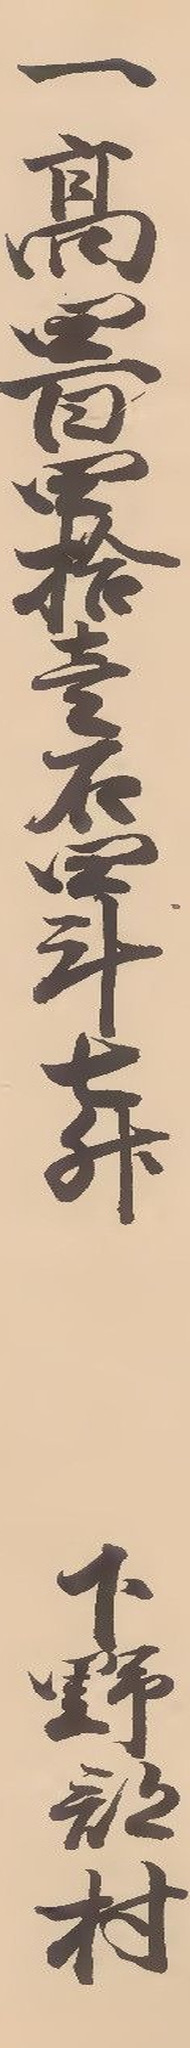一高四百四拾壱石四斗七升下野部村
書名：遠江国郷帳
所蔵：国立公文書館 National Archives of Japan
